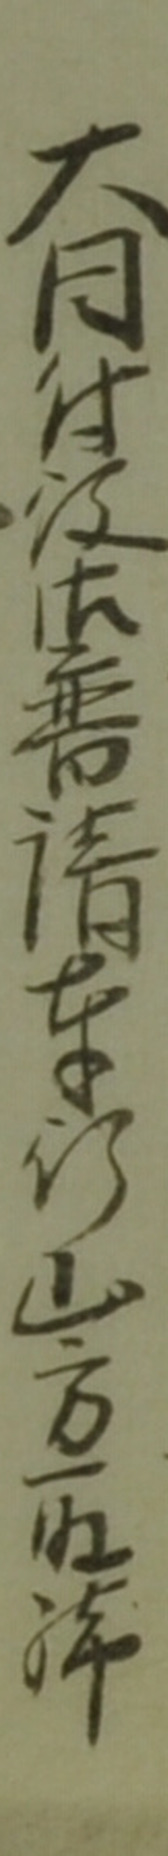大目付役御普請奉行山方取締
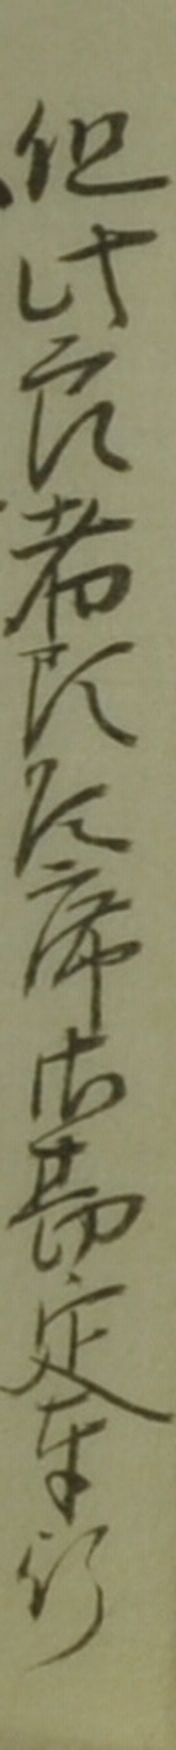但此節者頭次席御勘定奉行
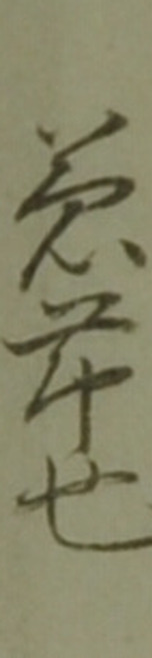兼帯也
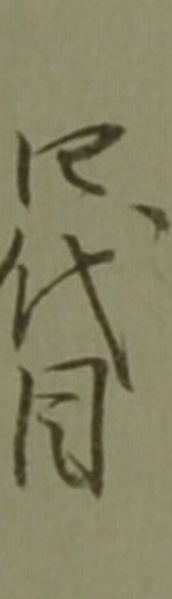四代目
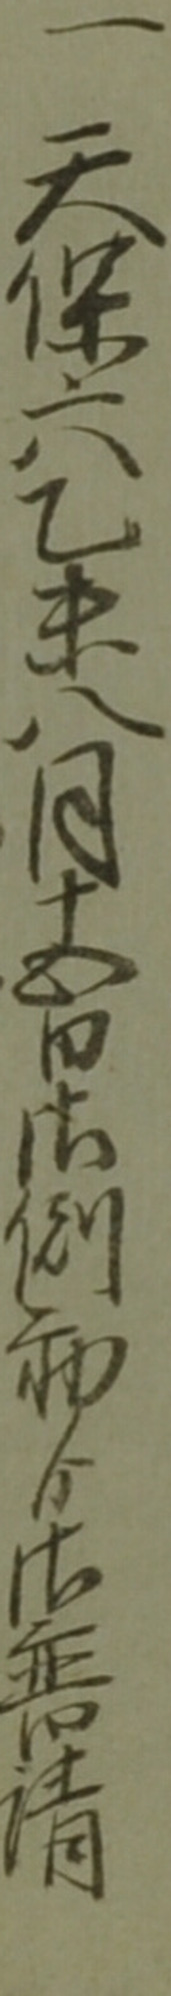一天保六乙未八月十五日御側勤ゟ御普請
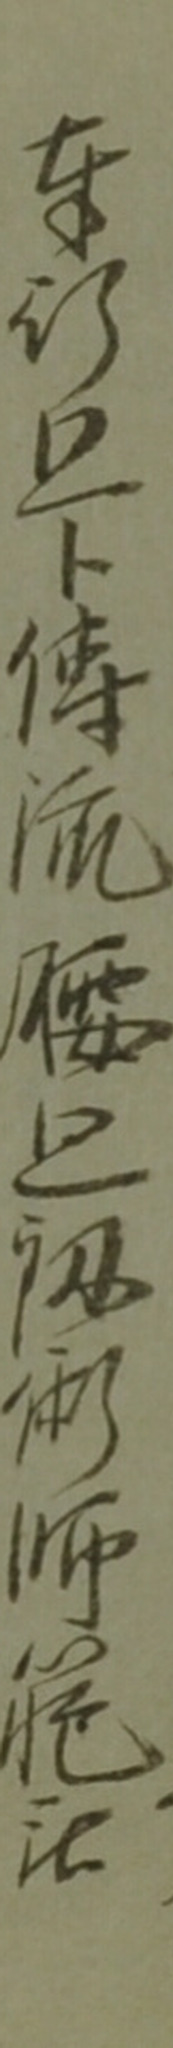奉行廻ト伝派腰廻剣術師範被
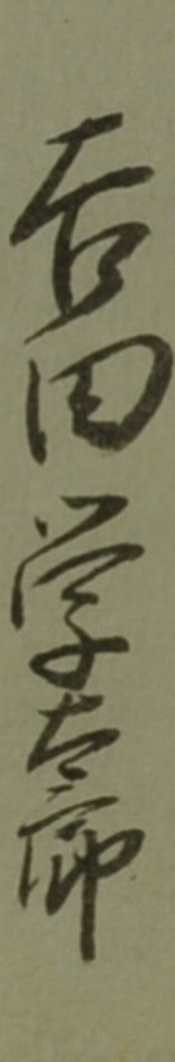吉田学太郎
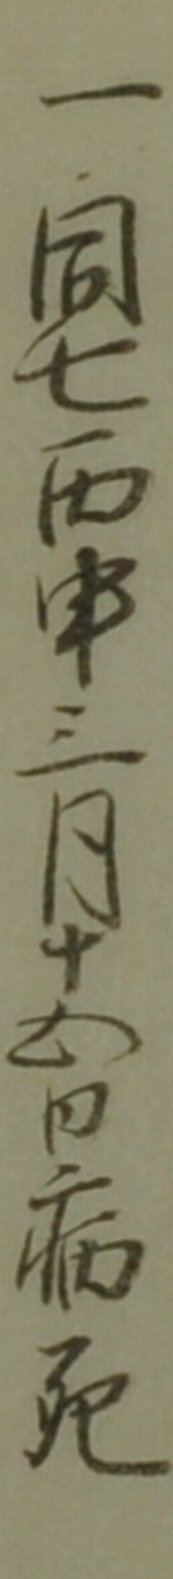一同七丙申三月十五日病死
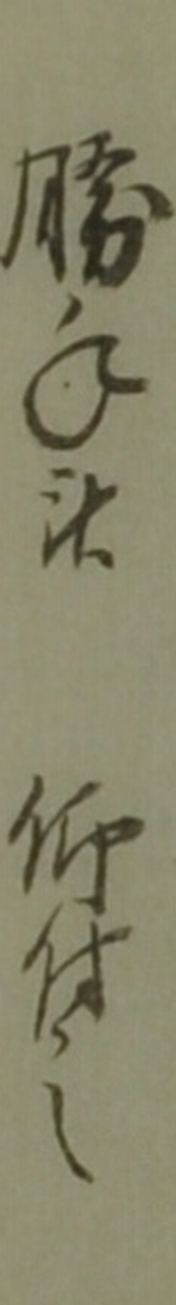勝手被仰付之
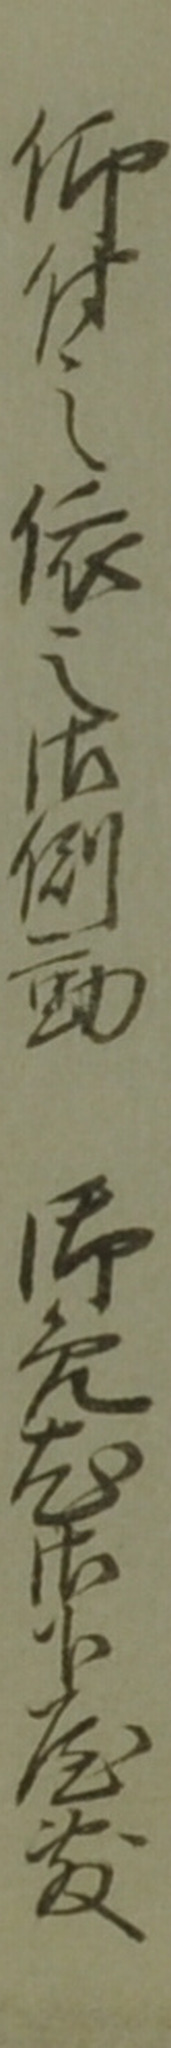仰付之依之御側勤御免尤御下屋敷
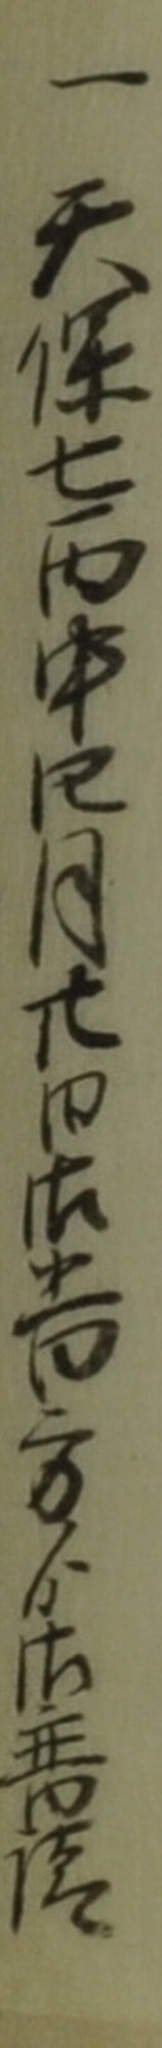一天保七丙申四月廿日御番方ゟ御普請
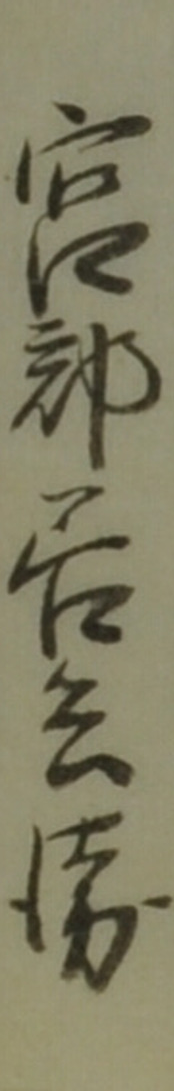宮部善兵衛
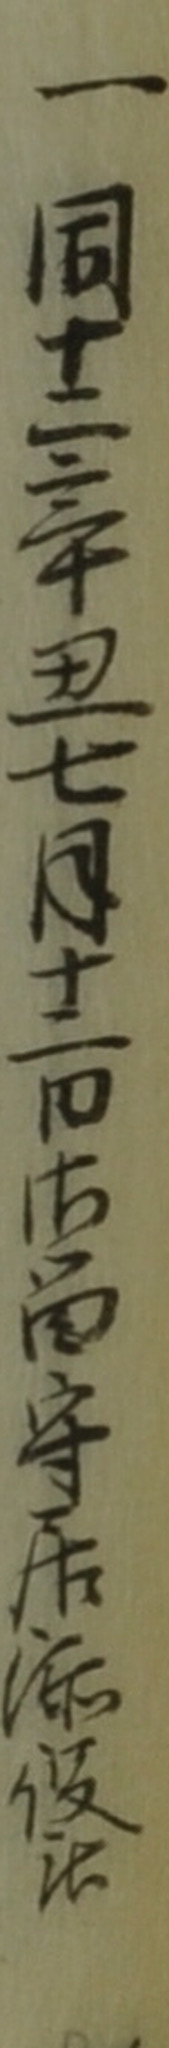一同十二辛丑七月十二日御留守居添役被
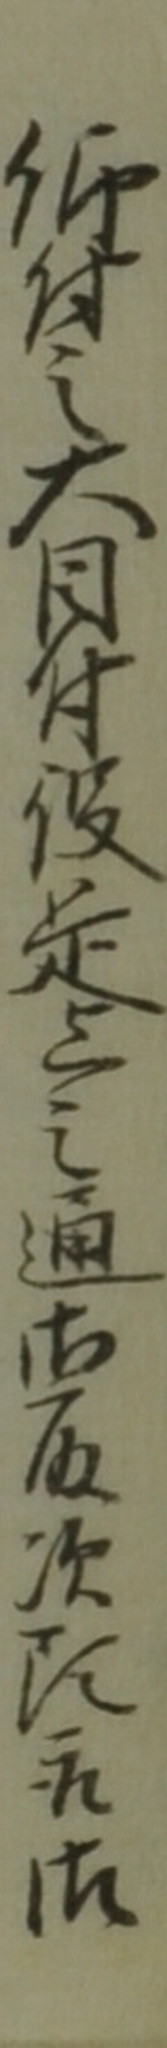仰付之大目付役是迄之通御取次頭取御
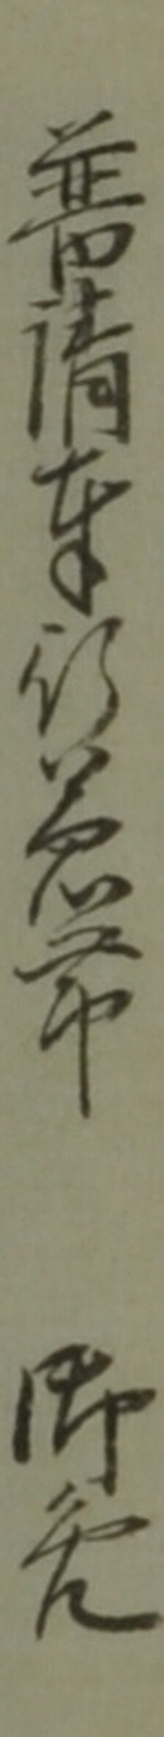普請奉行兼帯御免
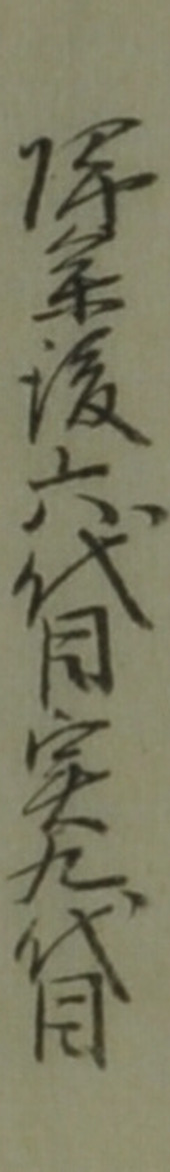帰参後六代目実九代目
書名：諸御役代々録（六）
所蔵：伊那市立高遠町図書館・合同会社AMANE
